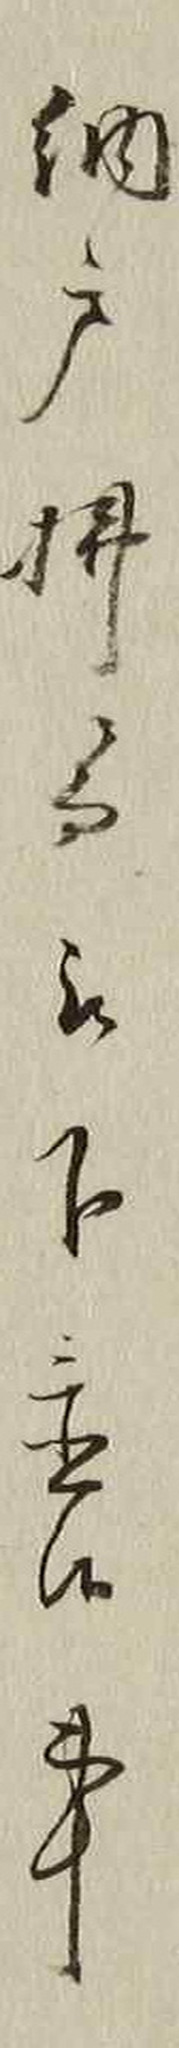納戸払ニ而被下置候事
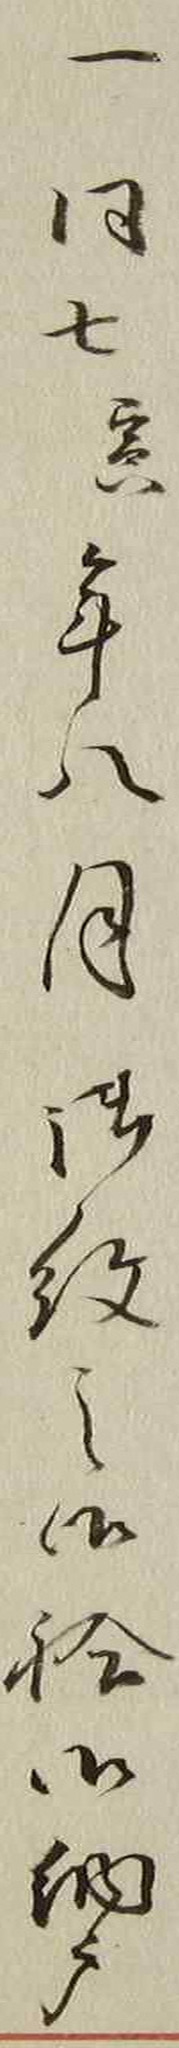一同七寅年八月御紋之御袷御納戸
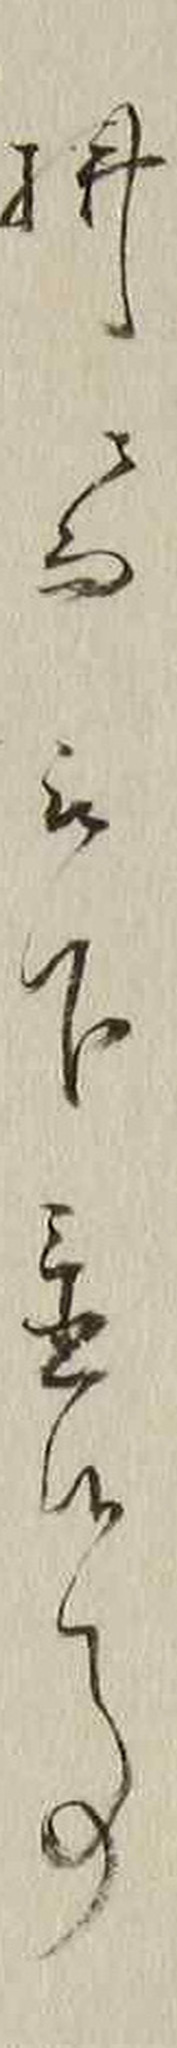払ニ而被下置候事
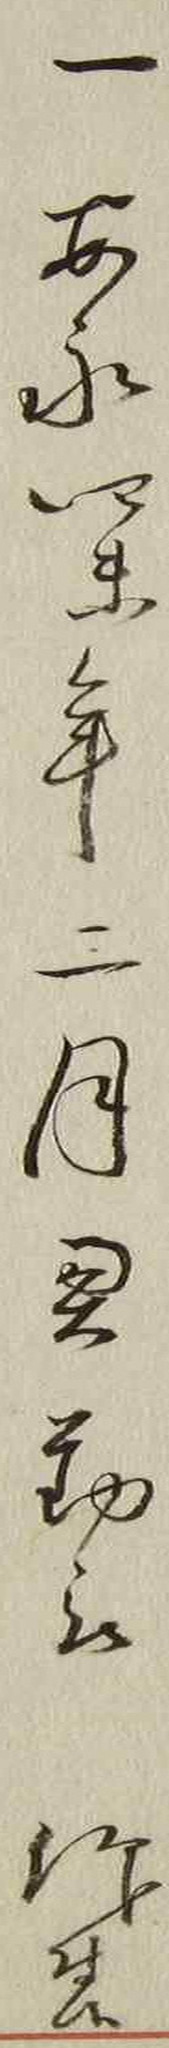一安永四未年二月奥勤被仰付候
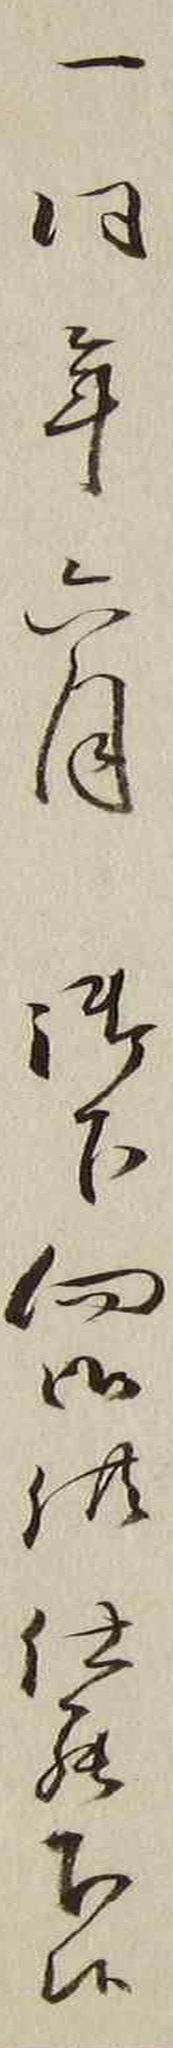一同年六月御下向御供仕罷下候
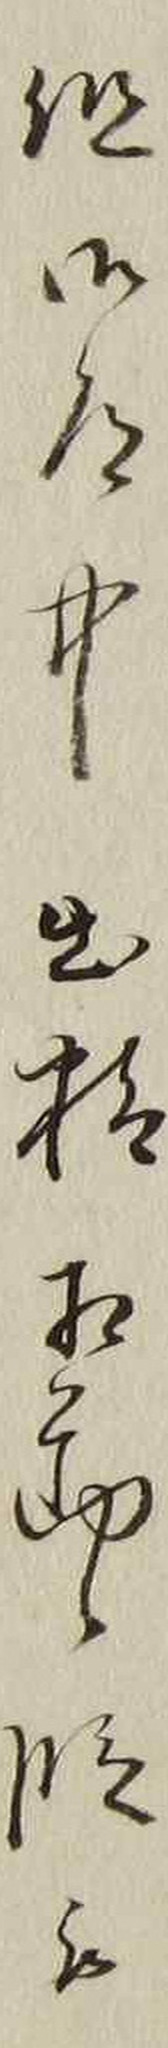但御道中出精相勤候段被
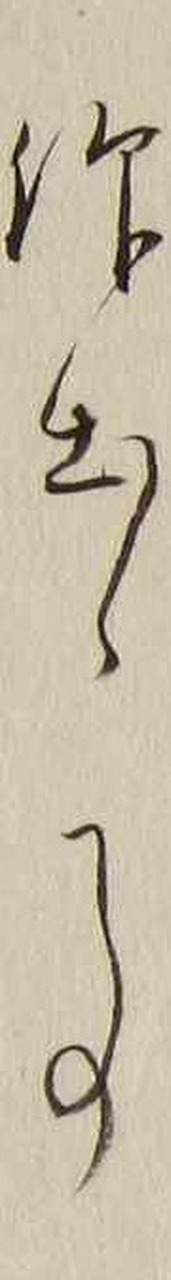仰出候事
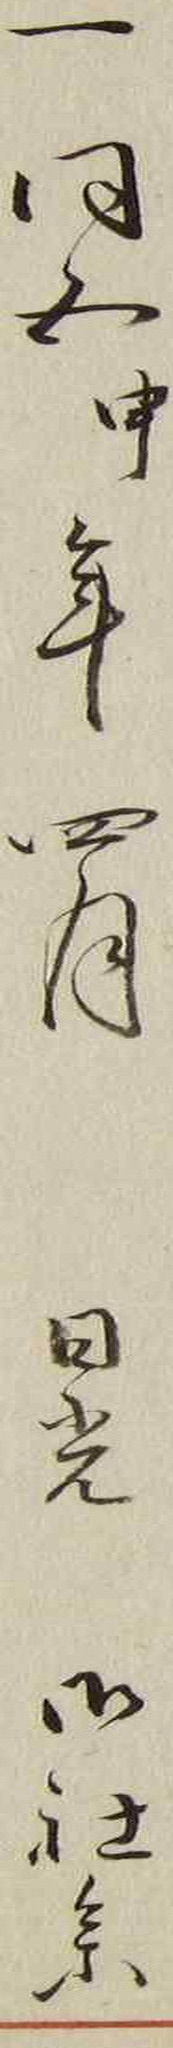一同五申年四月日光御社参

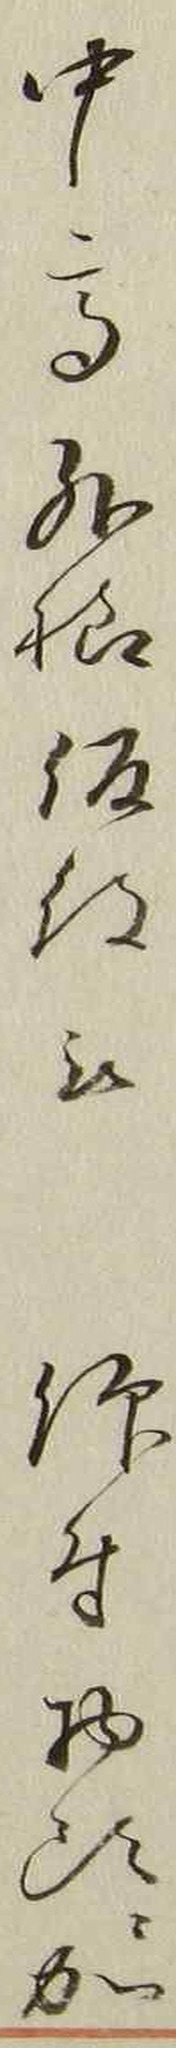中高外様仮役被仰付物頭ニ加
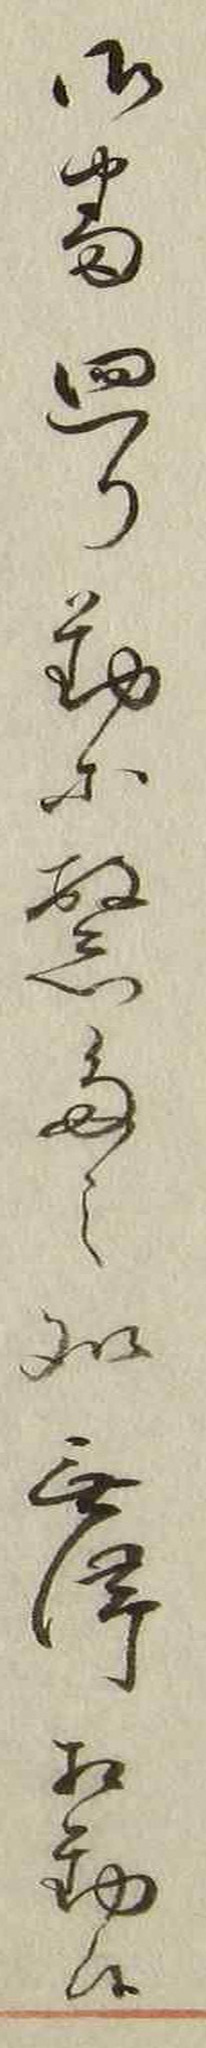御番廻り勤等繁多之処無滞相勤候
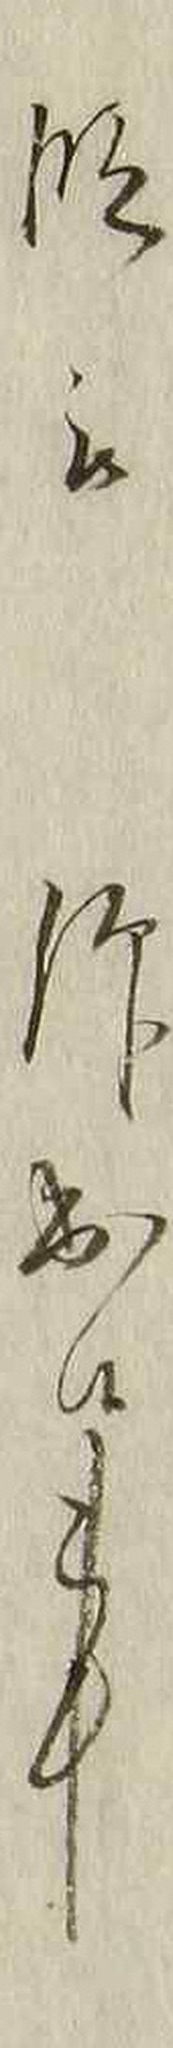段被仰出候事
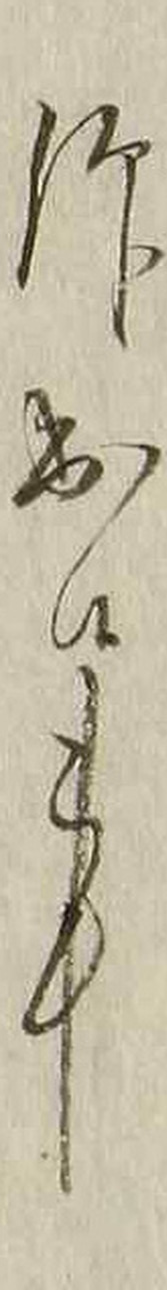仰出候事
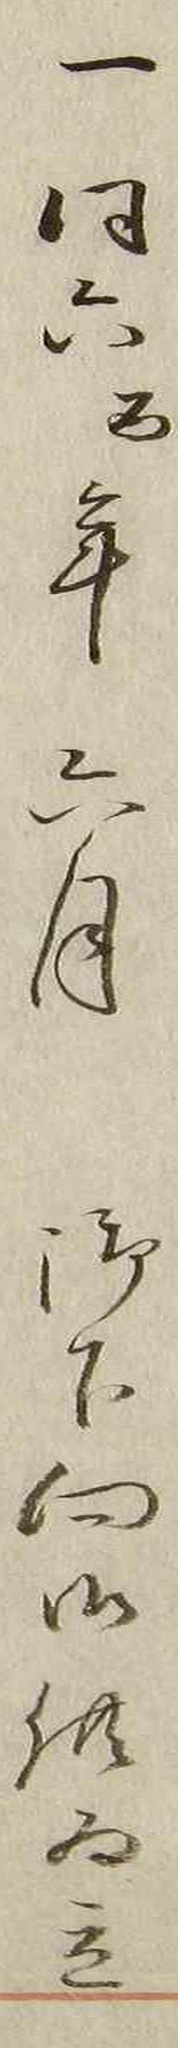一同六酉年六月御下向御供為立
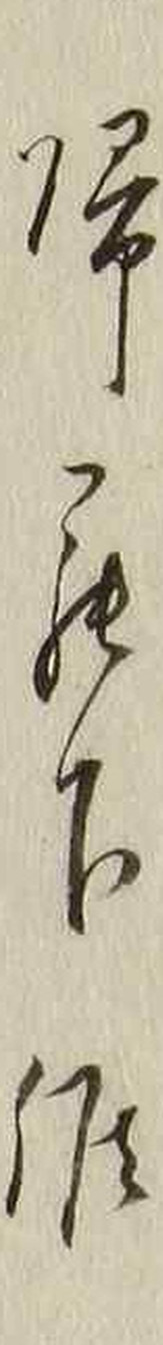帰罷下候
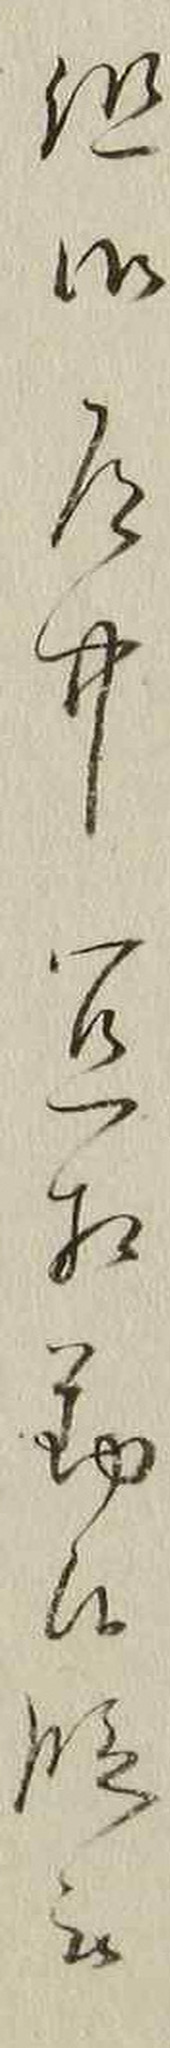但御道中宜相勤候段被
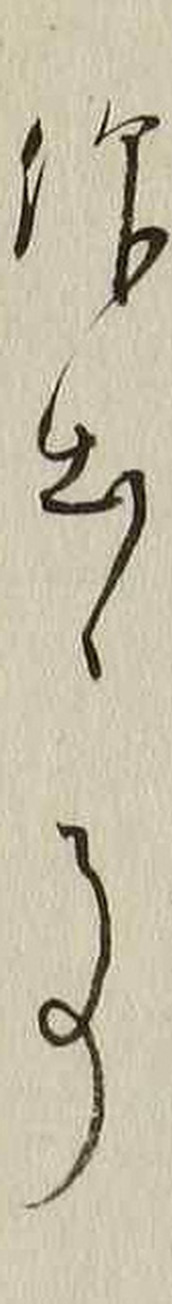仰出候事
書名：諸士系譜　巻之28　い之部28
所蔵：会津若松市立会津図書館
